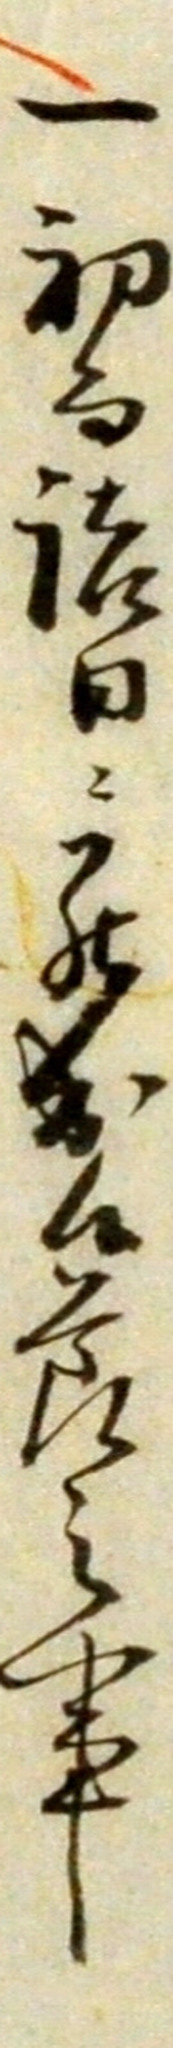一初て詰日に罷出候節之事
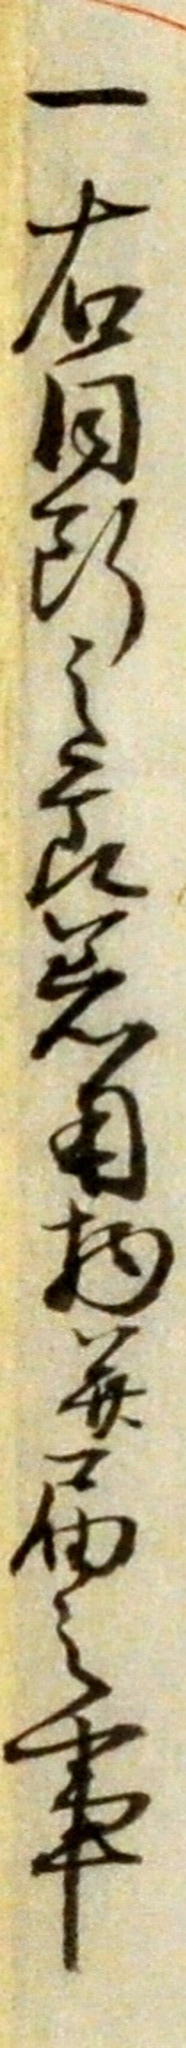一右同断之節着用物并届之事
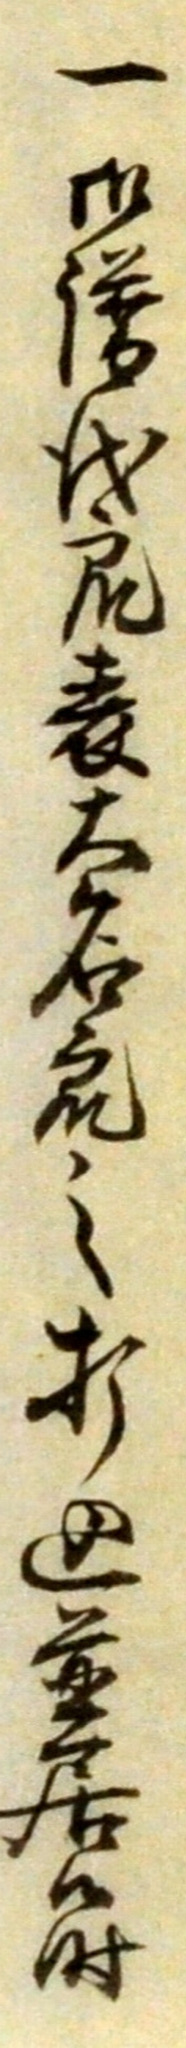一御譜代衆表大名衆之打込並居候時
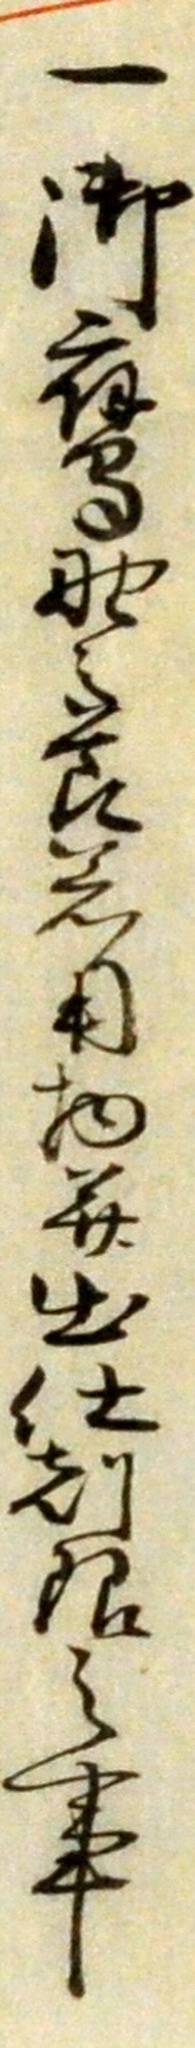一御鷹野之節着用物并出仕刻限之事
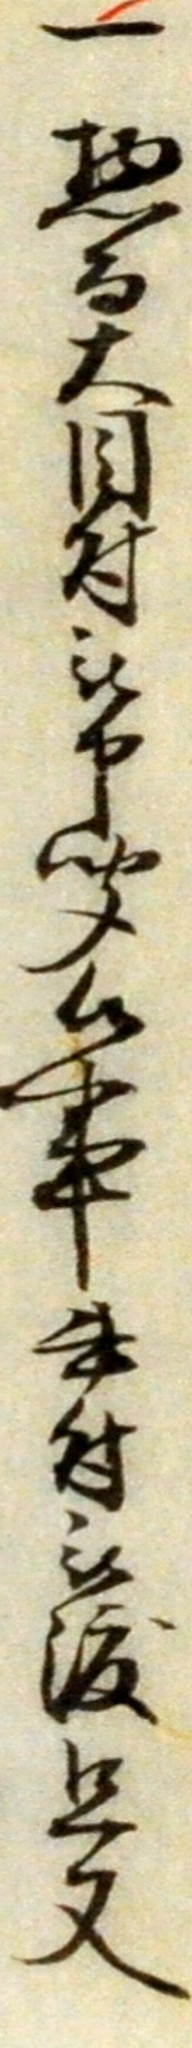一惣て大目付被申聞候事書付被渡且又
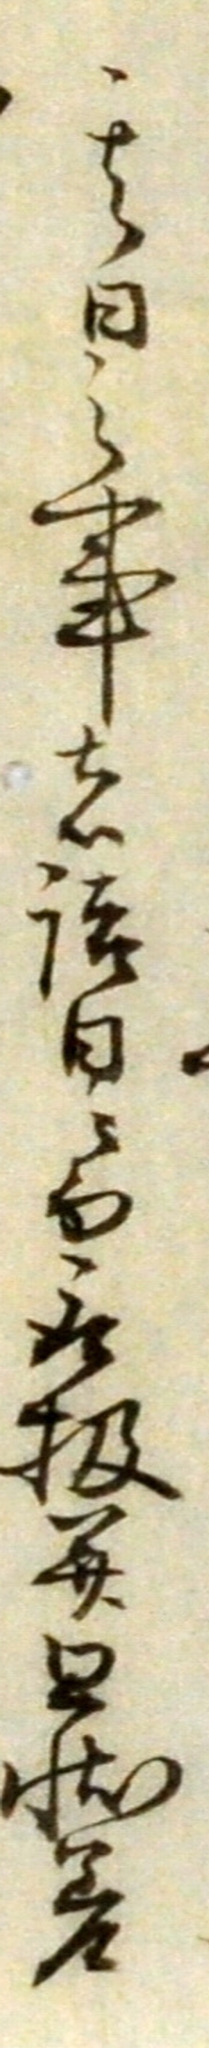其日之事は詰日にて取扱并廻状差
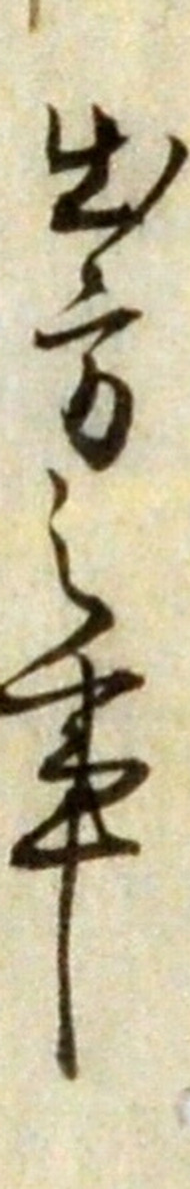出方之事
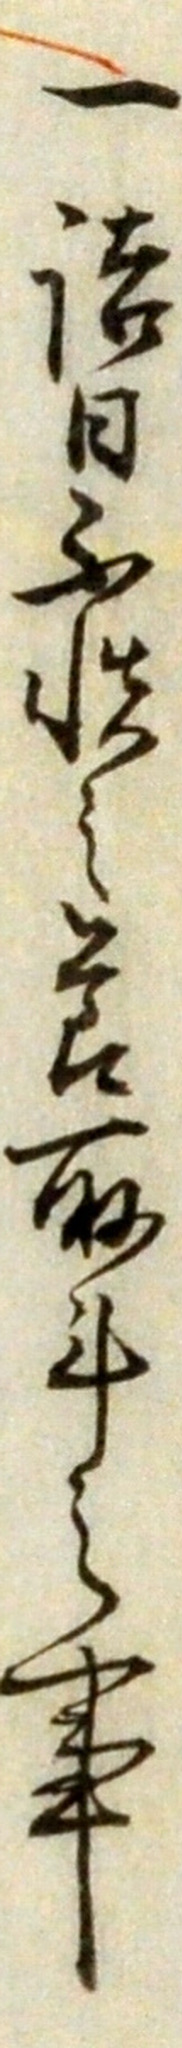一詰日不快之節取斗之事
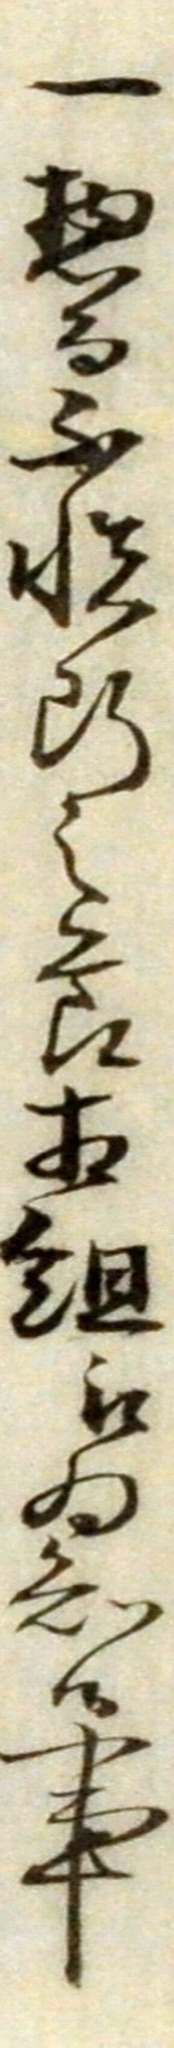一惣て不快断之節相組え為知候事
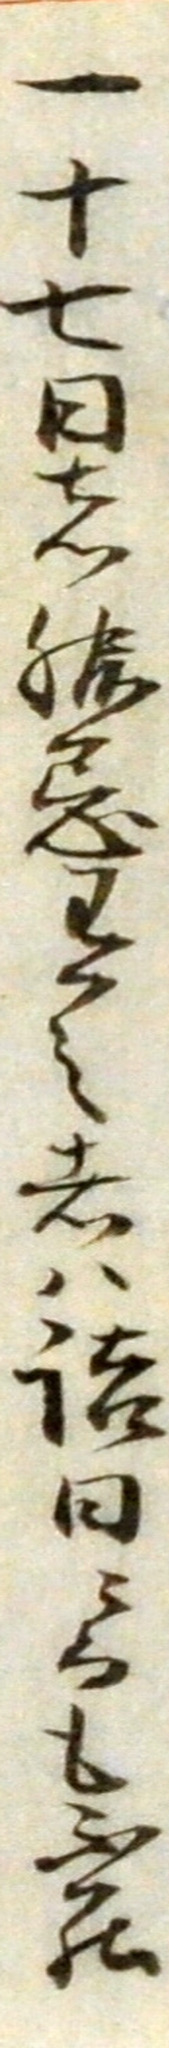一十七日は服忌有之者は詰日にても不罷
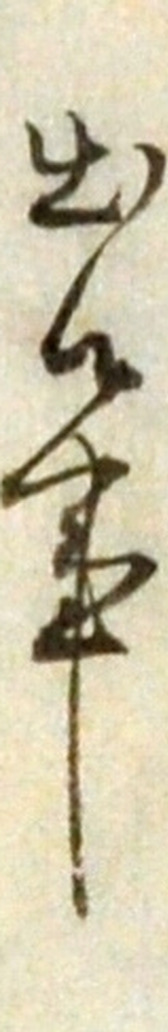出候事
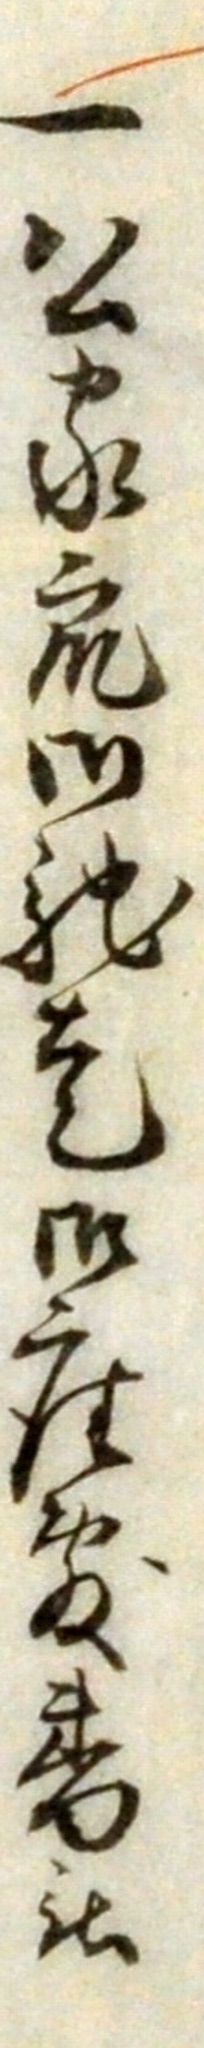一公家衆御馳走御座敷番被
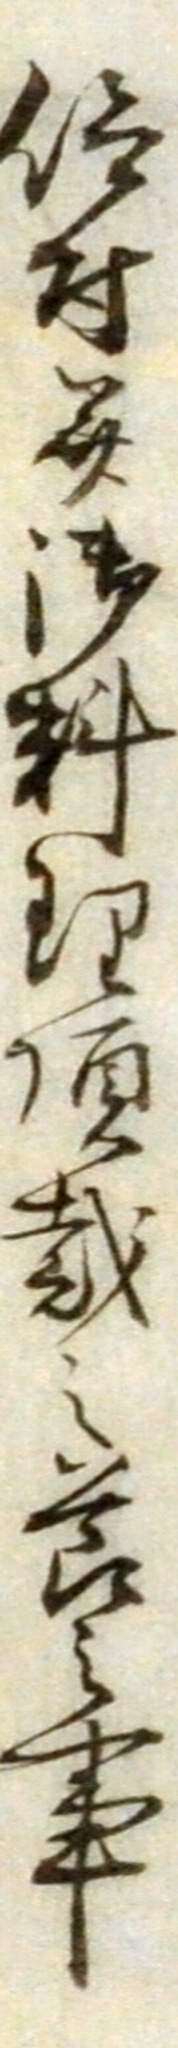仰付并御料理頂戴之節之事
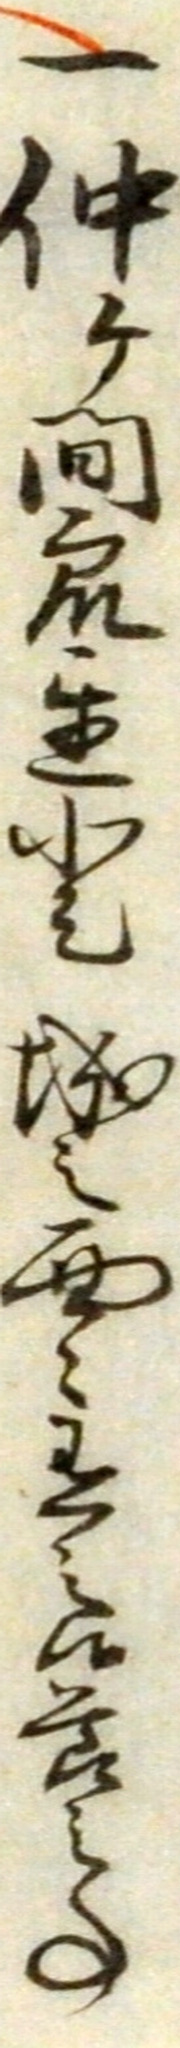一仲ヶ間衆遅登城之面々有之候節之事
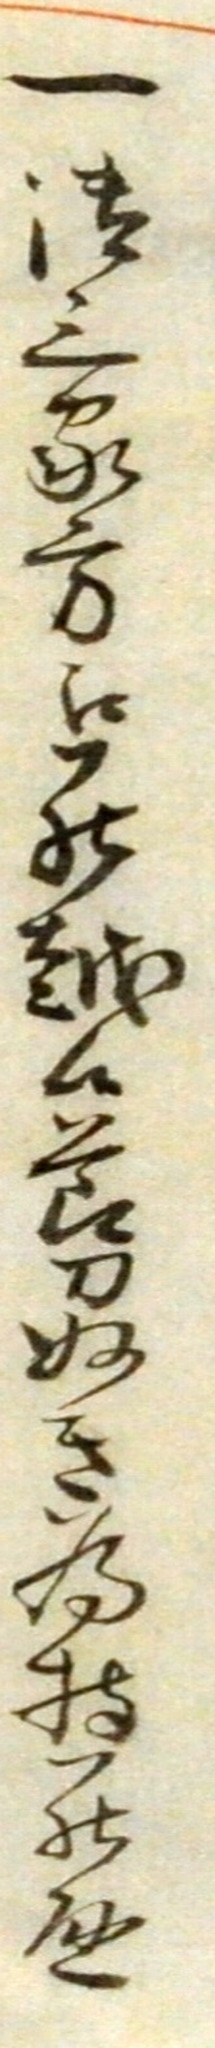一御三家方え罷越候節刀ぬき為持罷通
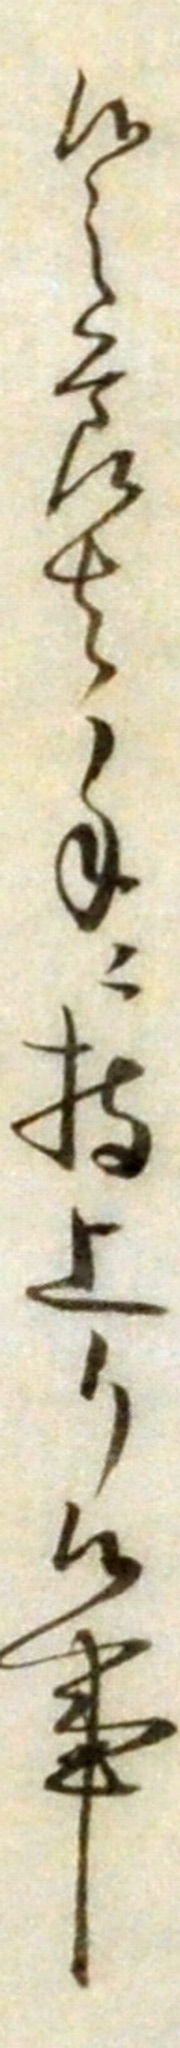候之節は手に持上り候事
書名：申合帳〔一括〕
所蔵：伊那市立高遠町図書館・合同会社AMANE
